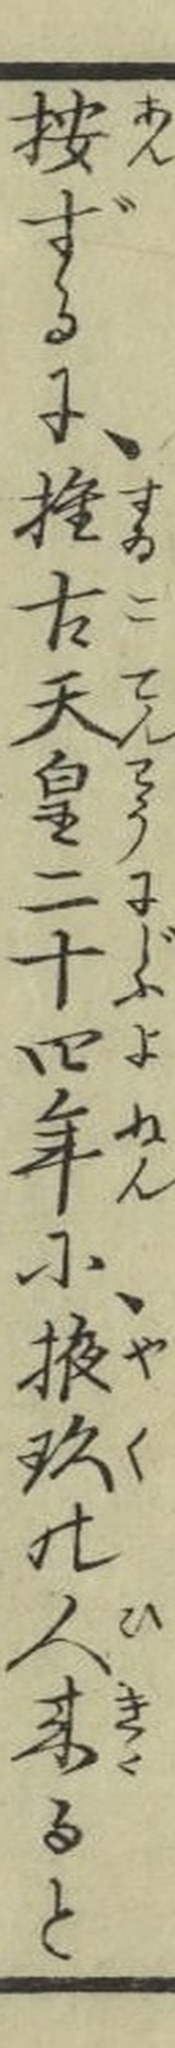按ずるに、推古天皇二十四年に掖玖の人来ると
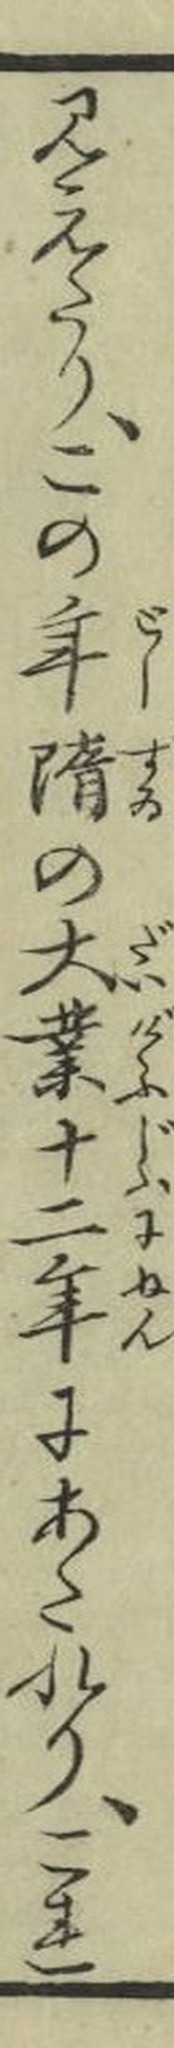見えたり、この年隋の大業十二年にあたれり、これ
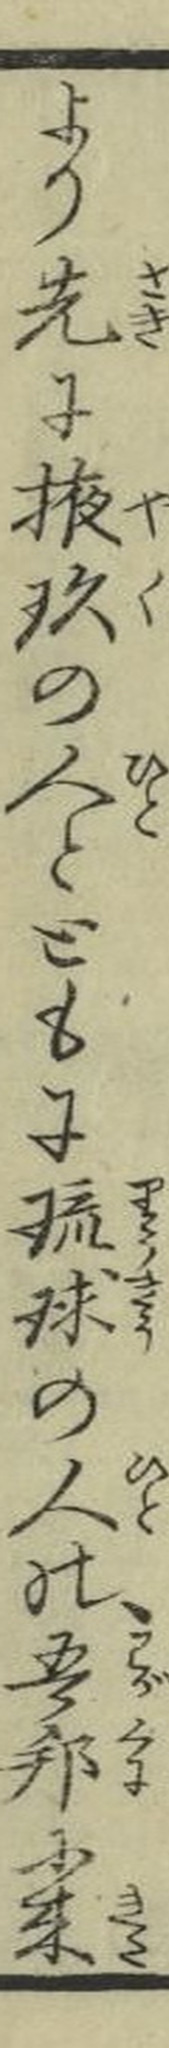より先に掖玖の人とともに琉球の人の、吾邦に来

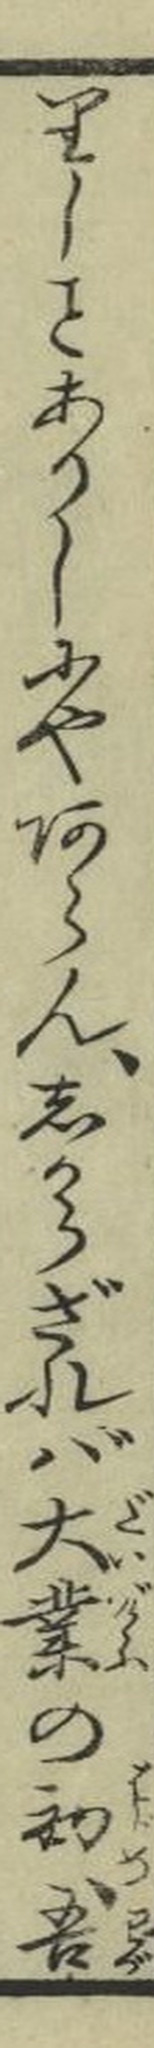りしことありしにやあらん、しからざれば大業の初、吾
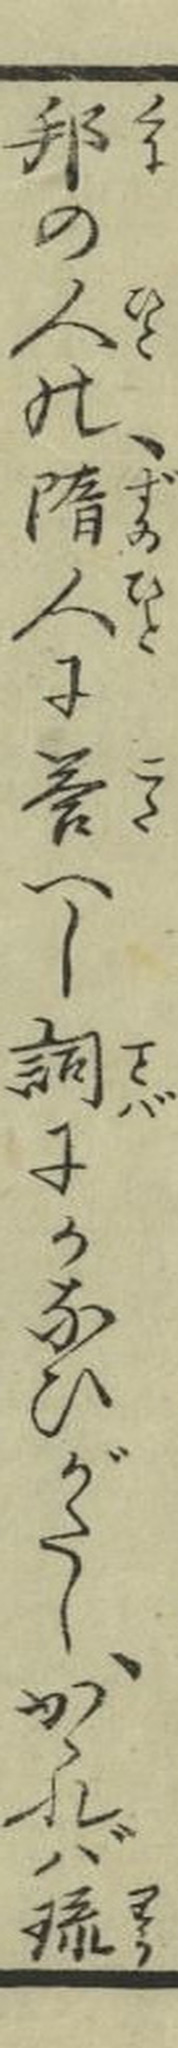邦の人の、隋人に答へし詞にかなひがたし、かゝれば琉
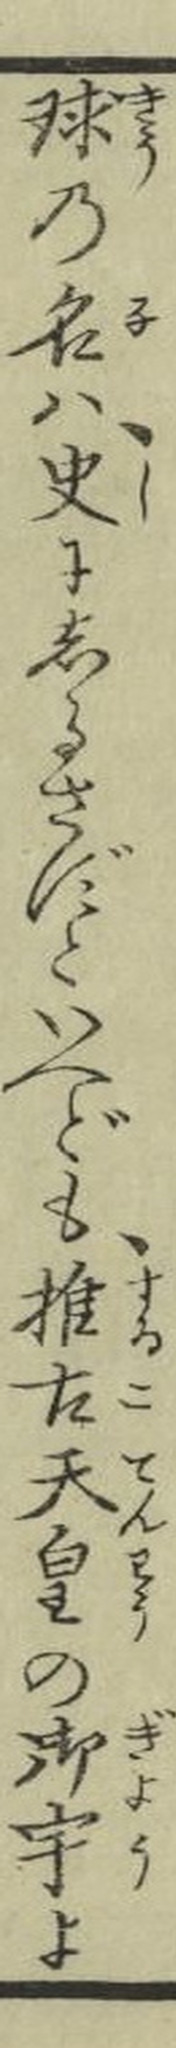球の名は、史にしるさずといへども、推古天皇の御宇よ
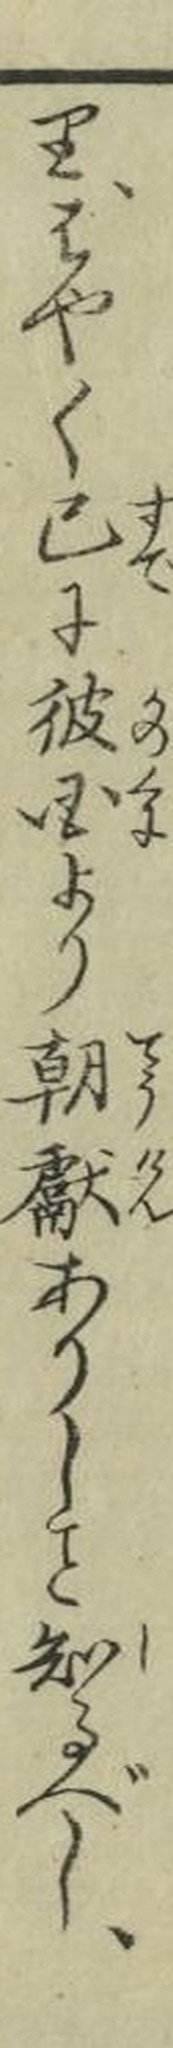り、はやく已に彼国より朝献ありしこと知るべし、
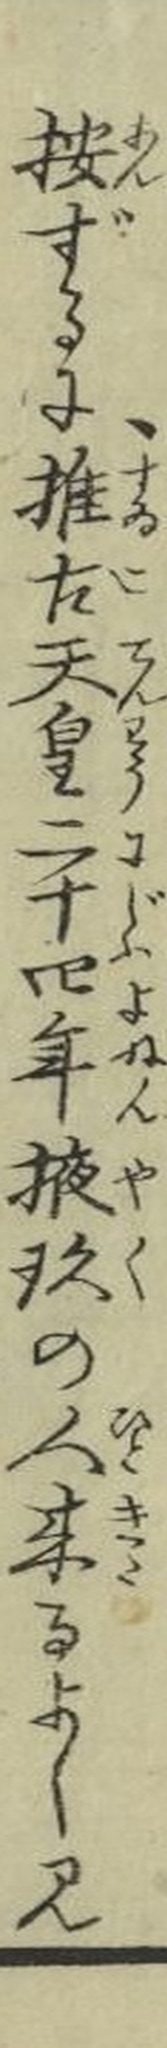按ずるに、推古天皇二十四年掖玖の人来るよし見
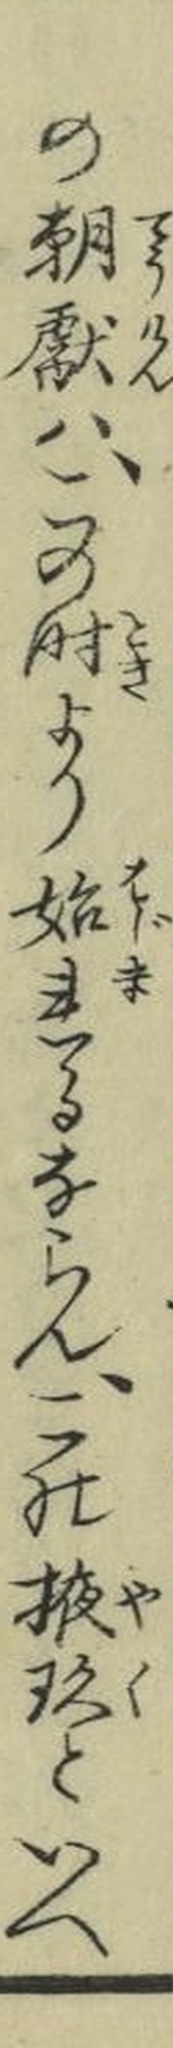の朝献は、この時より始れるならん、この掖玖といへ
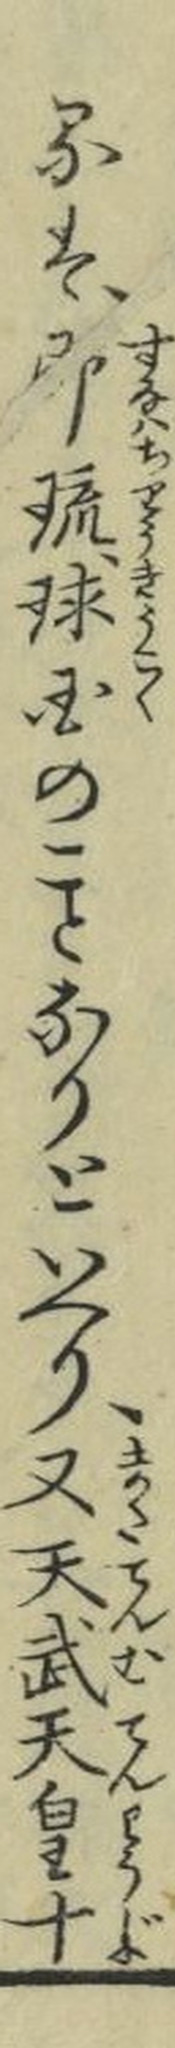るは、即琉球国のことなりといへり、又天武天皇十
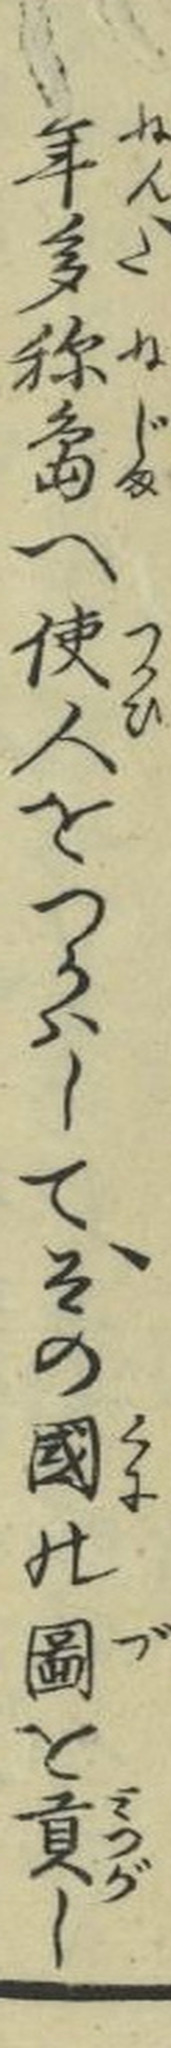年、多祢島へ使人をつかはして、その国の図を貢し
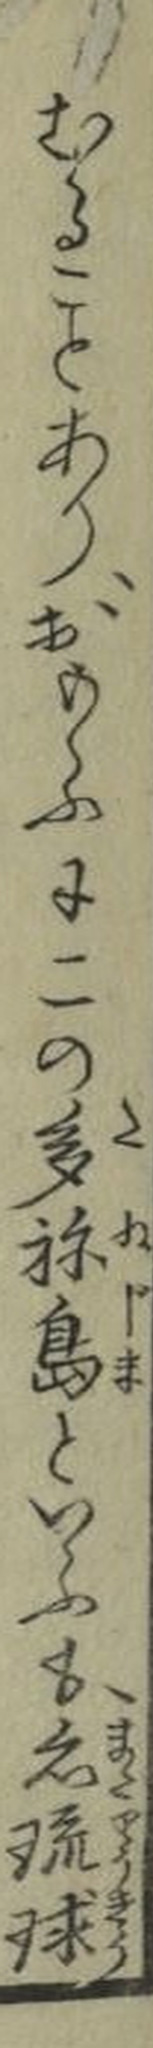むることあり、おもふにこの多祢島といふも、亦琉球
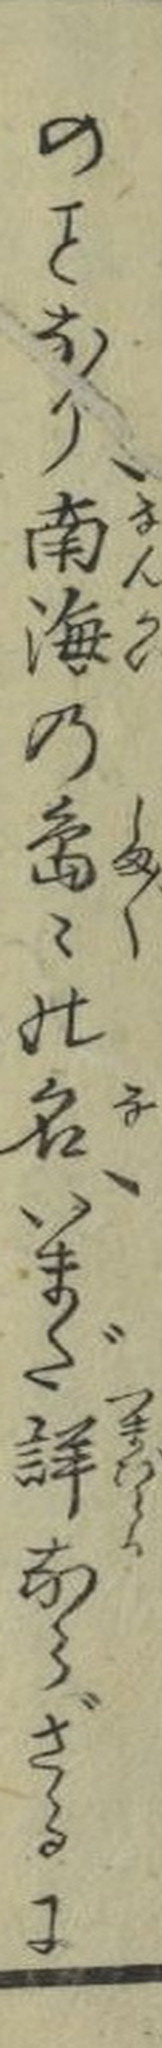のことなり、南海の島々の名、いまだ詳ならざるに
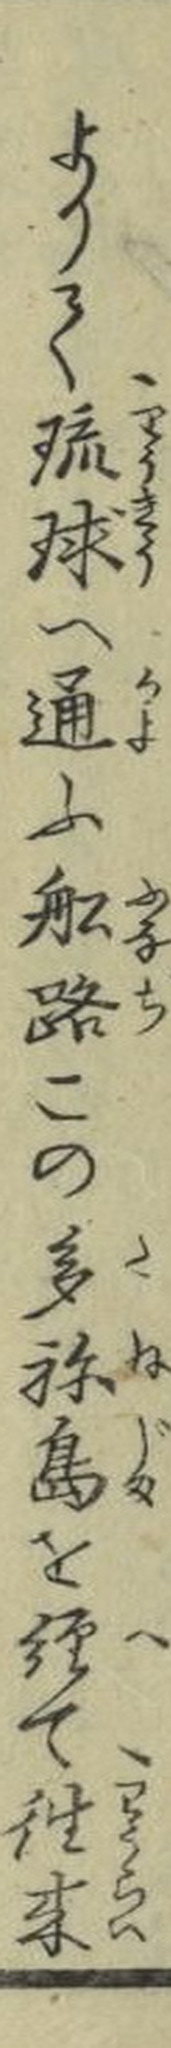よりて、琉球へ通ふ船路この多祢島を経て、往来
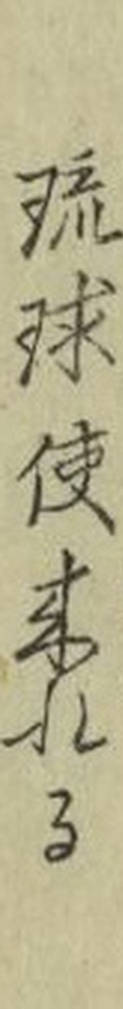琉球使来れる
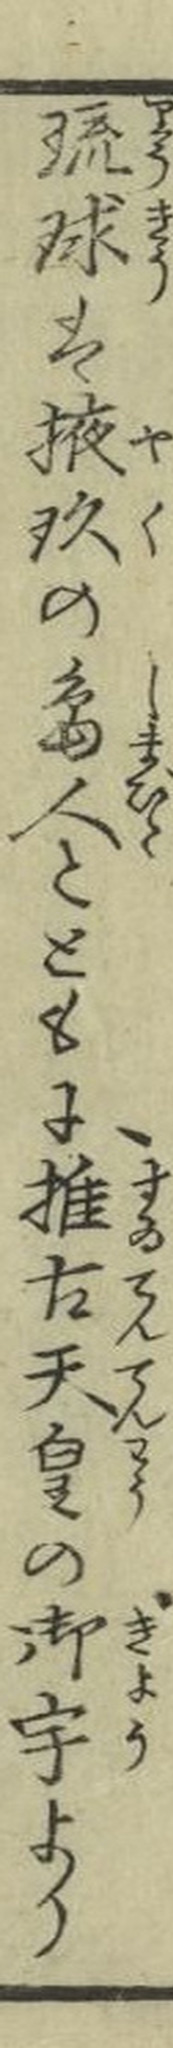琉球は掖玖の島人とともに、推古天皇の御宇より
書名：琉球入貢紀略
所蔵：University of the Ryukyus Library
